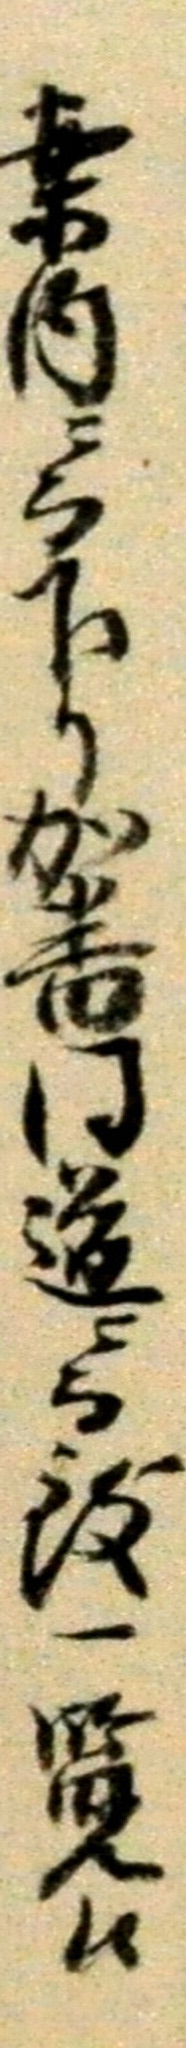案内ニ而下り加番同道ニ而致一覧候
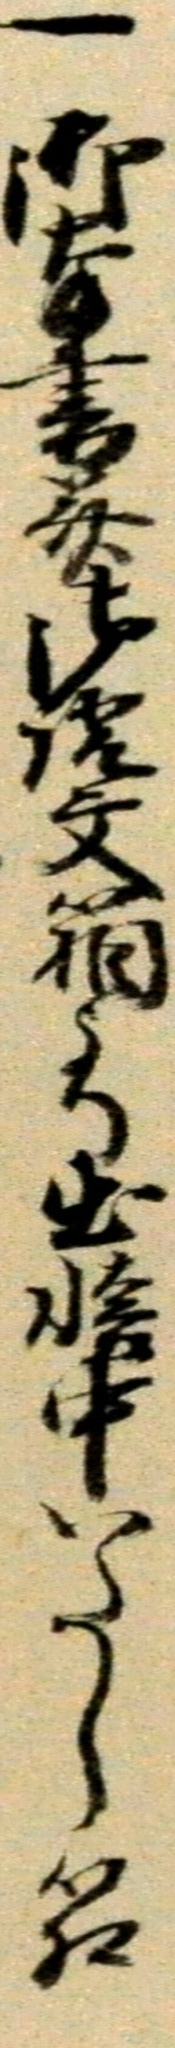一御奉書幷御證文箱より出懐中いたし箱
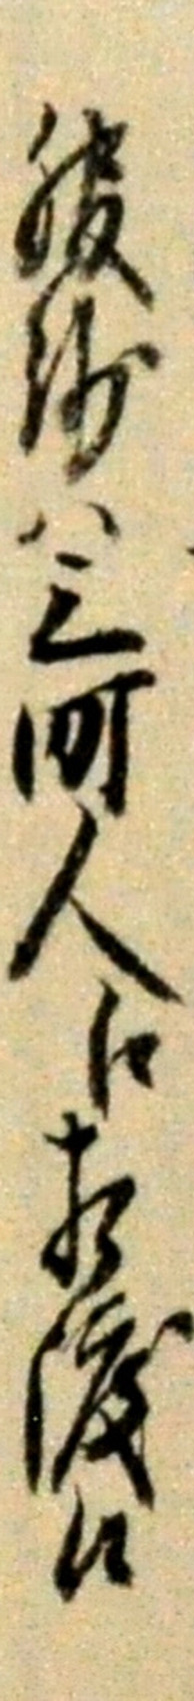服紗ㇵ三町人江相渡候
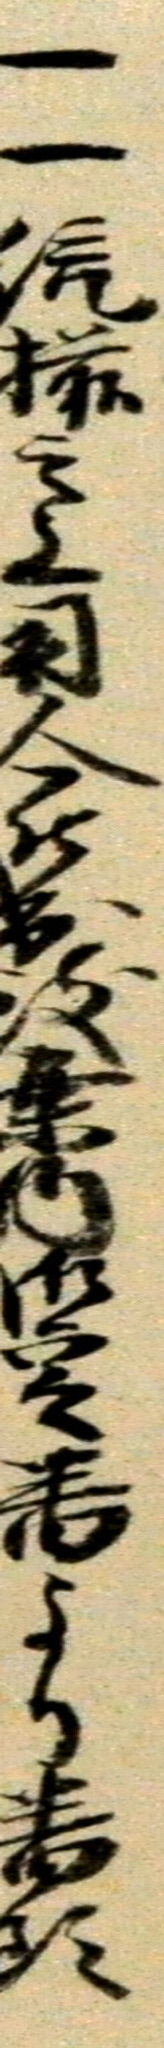一一統揃之上用人罷出致案内御定番より番頭

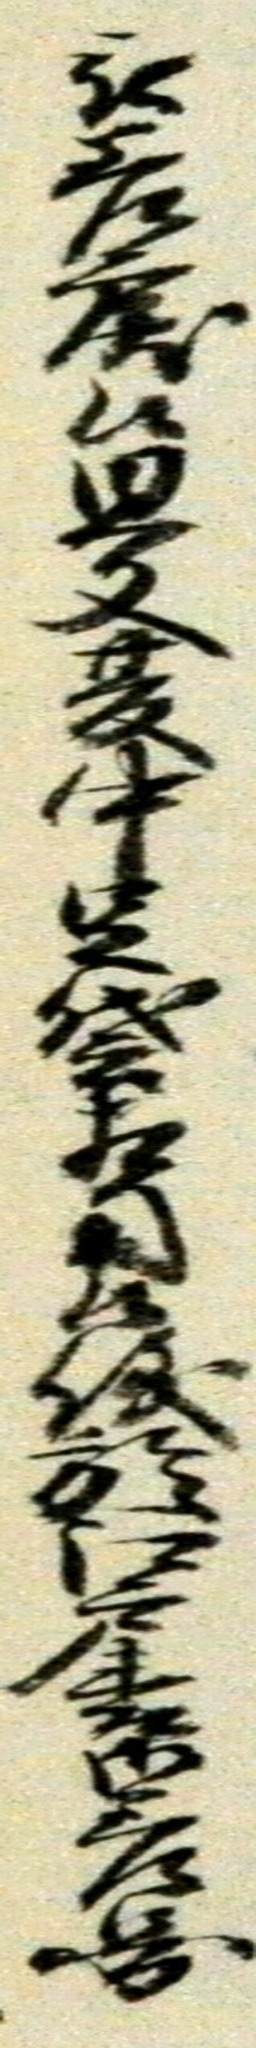被差戻候且又夏中足袋相用候儀於江戸表御差図
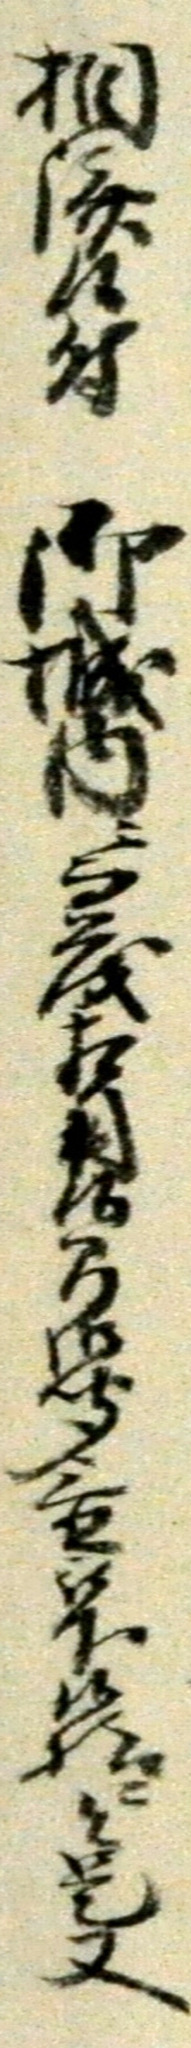相済候御城内ニ而茂相用候間御聞置被下候様ニと是又
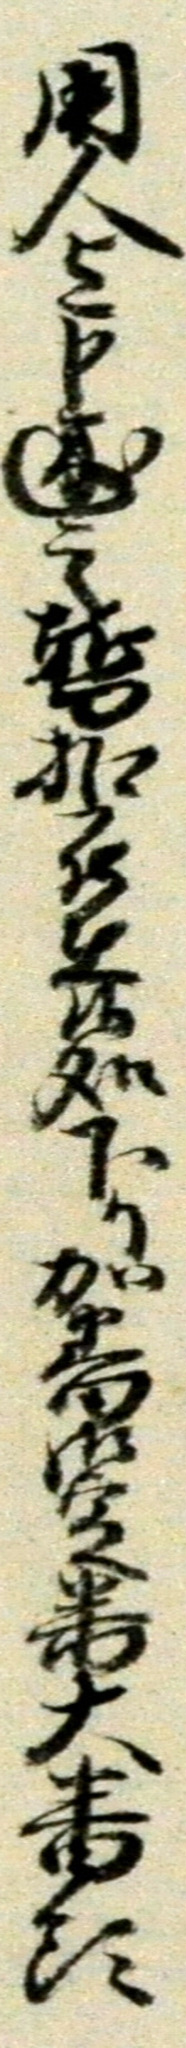用人迄申述之暫扣罷在候処下り加番御定番大番頭
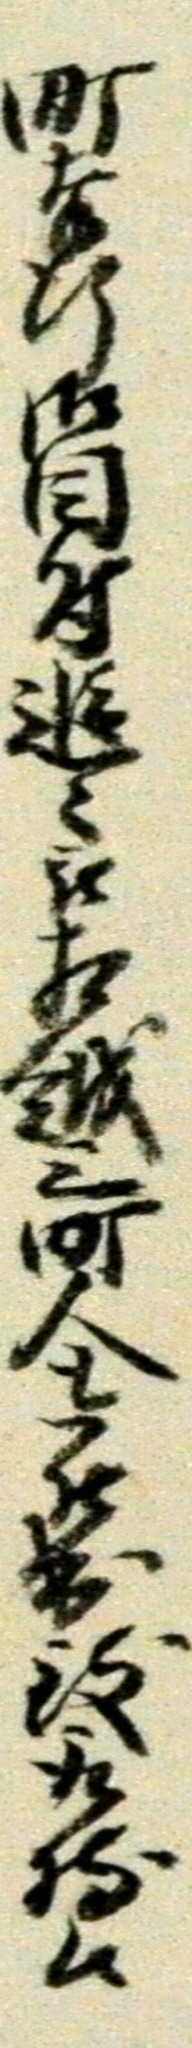町奉行御目付追々被相越三町人も罷出致取持候
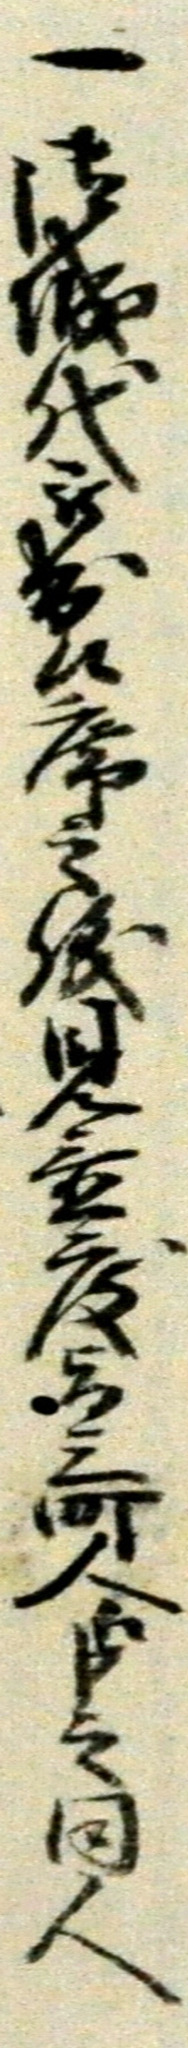一御城代被出候席之儀見置度旨三町人江申之同人
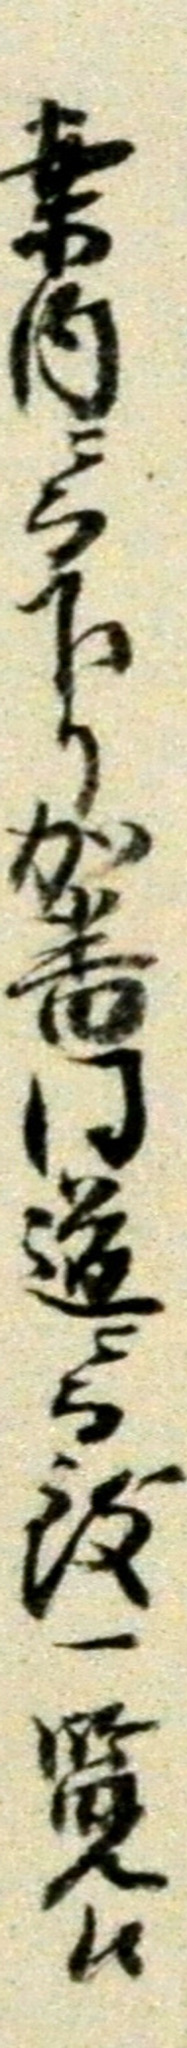案内ニ而下り加番同道ニ而致一覧候
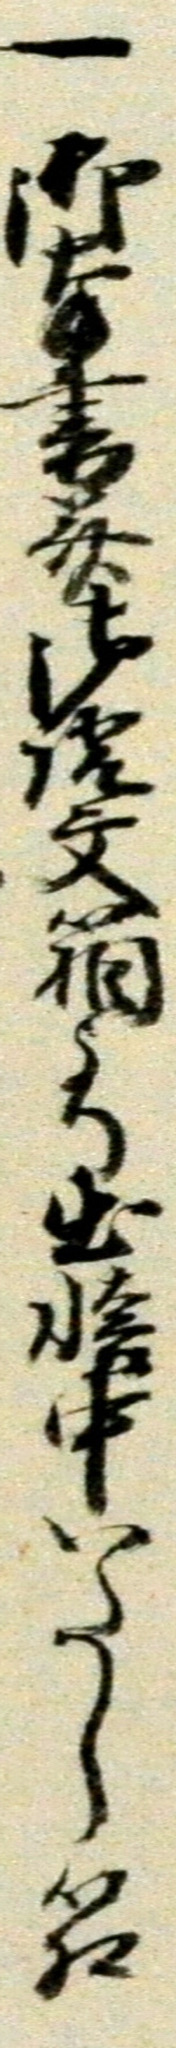一御奉書幷ニ御證文箱より出懐中いたし箱
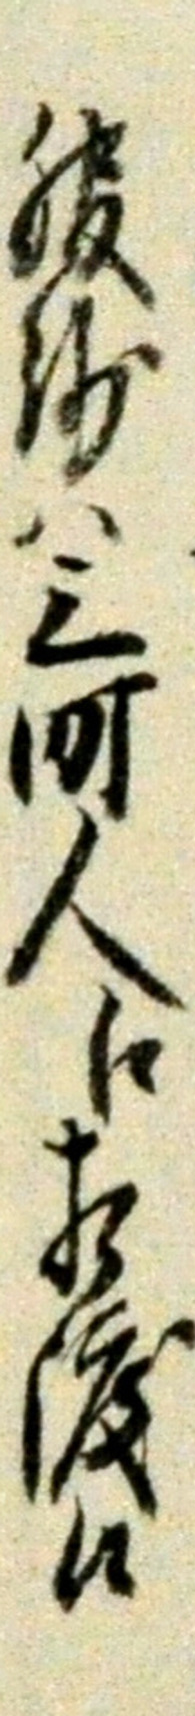服紗ㇵ三町人江相渡候
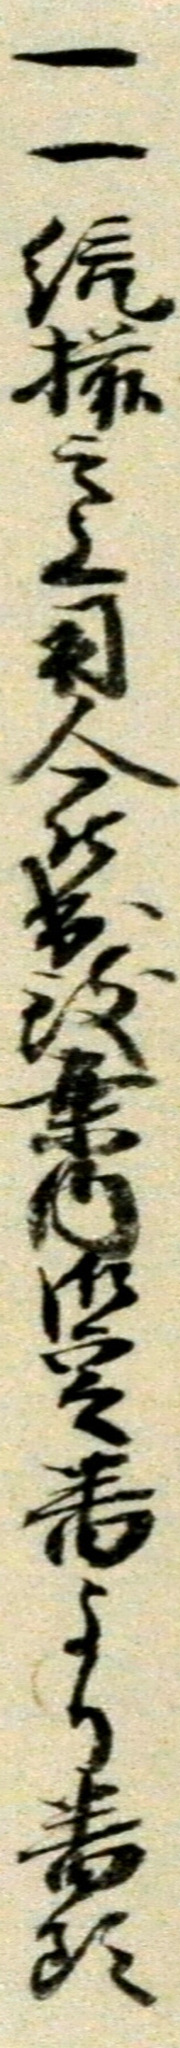一一統揃之上用人罷出致案内御定番より番頭
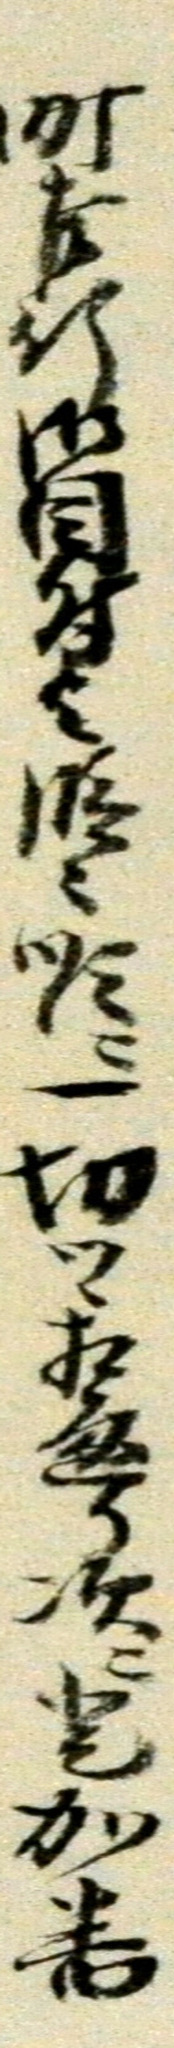町奉行御目付者段々順ニ一切ツツ相通り次二登加番
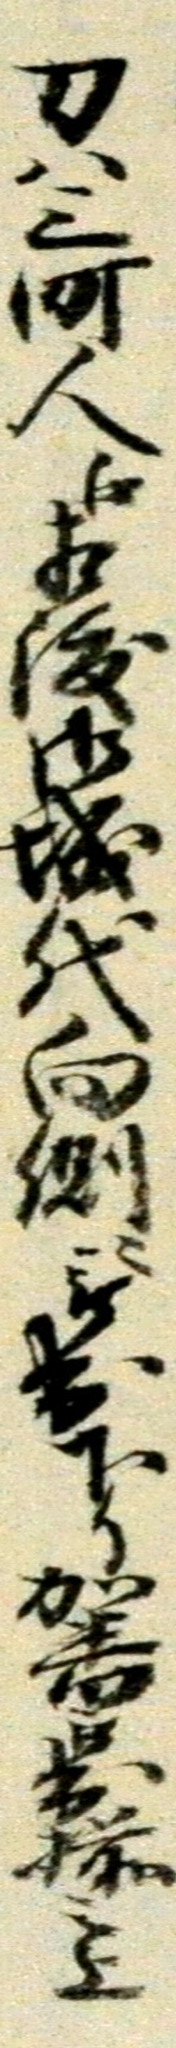刀ㇵ三町人江相渡御城代向側ニ被出下り加番被出揃之上
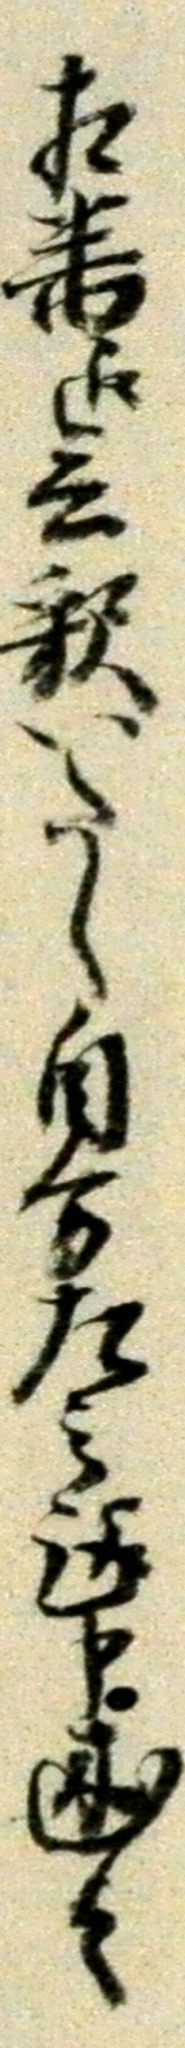相番江会釈いたし自分左之趣申ヒ述之
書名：大阪加番関係諸書留〔一括〕
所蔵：伊那市立高遠町図書館・合同会社AMANE
